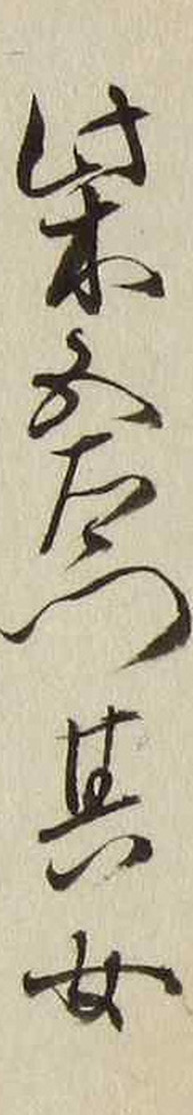柴五右衛門其女
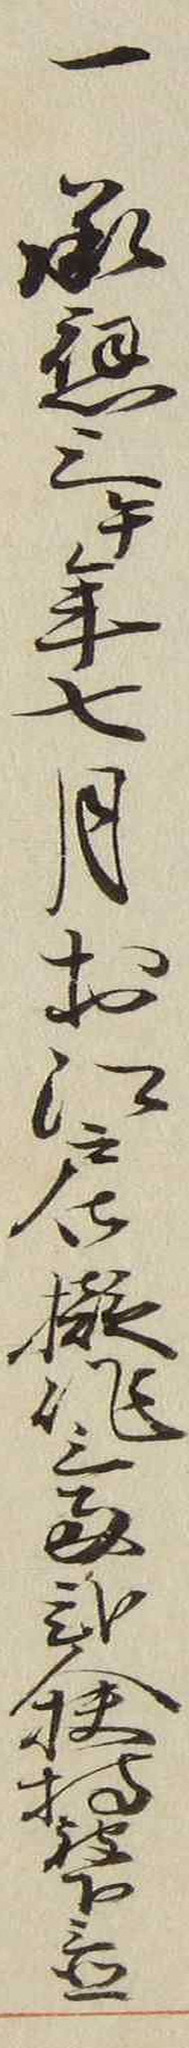一承応三午年七月於江戸御擬作三両弐人扶持被下置

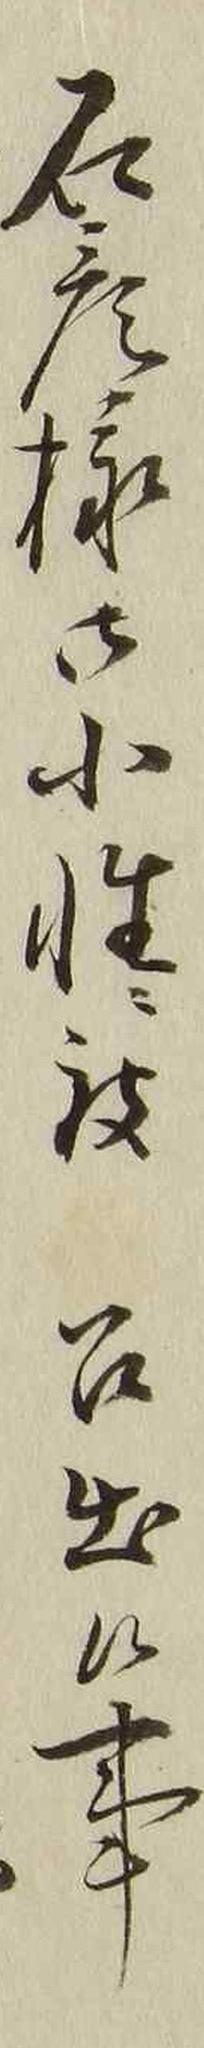石彦様御小性に被召出候事
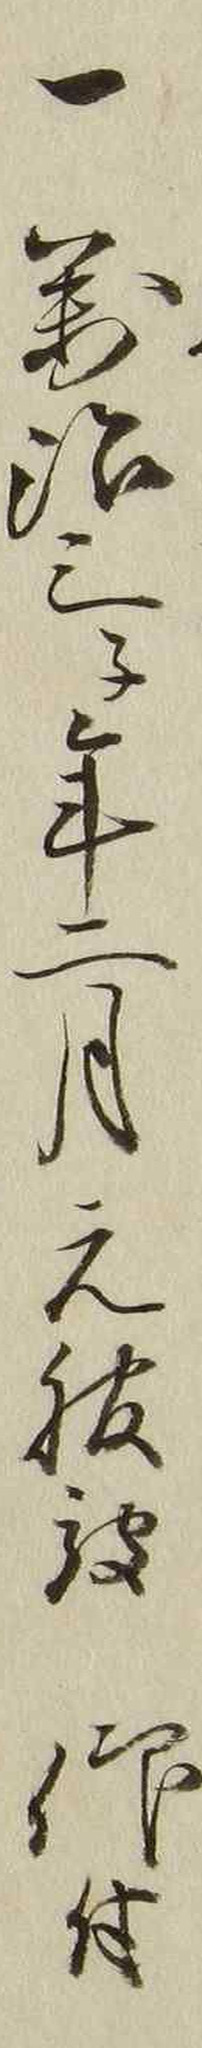一万治三子年二月元服被仰付
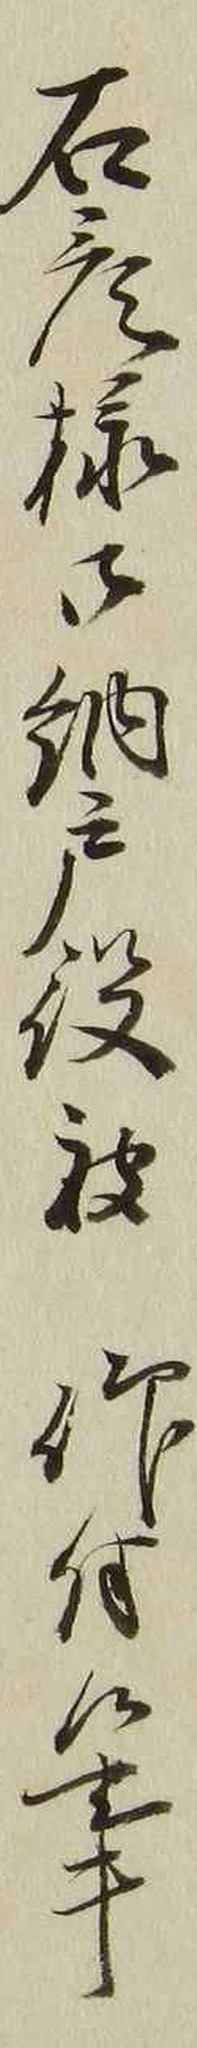石彦様御納戸役被仰付候事
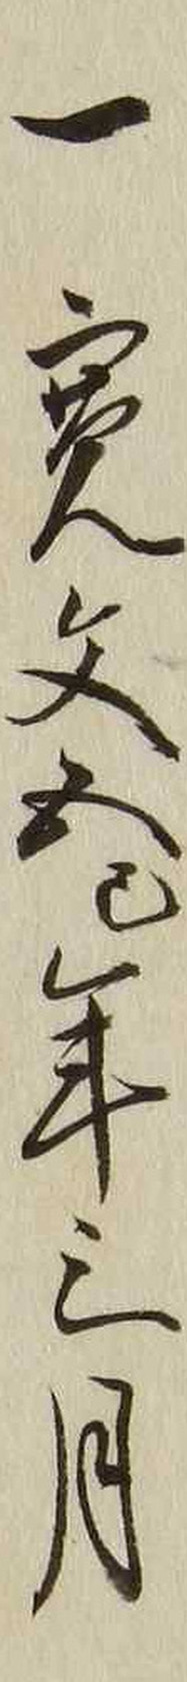一寛文五巳年三月
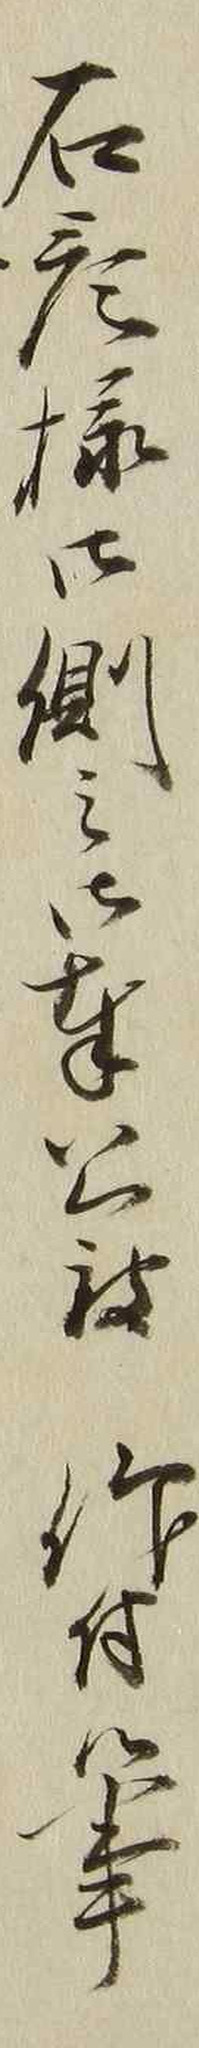石彦様御側之御奉公被仰付候事
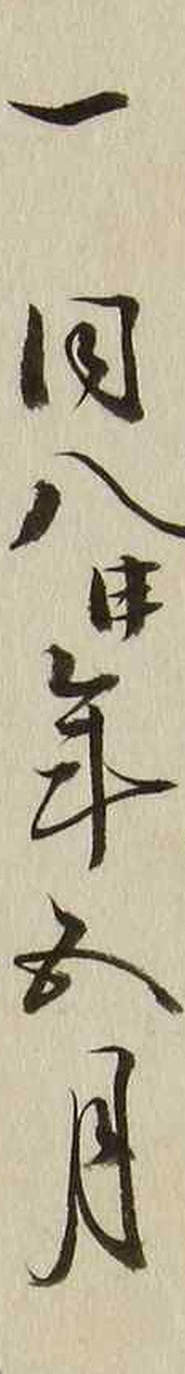一同八申年五月
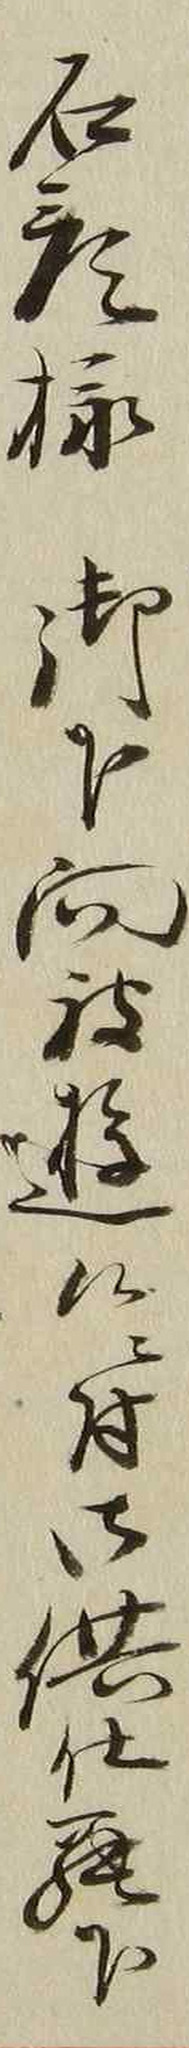石彦様御下向被遊候に付御供仕罷下
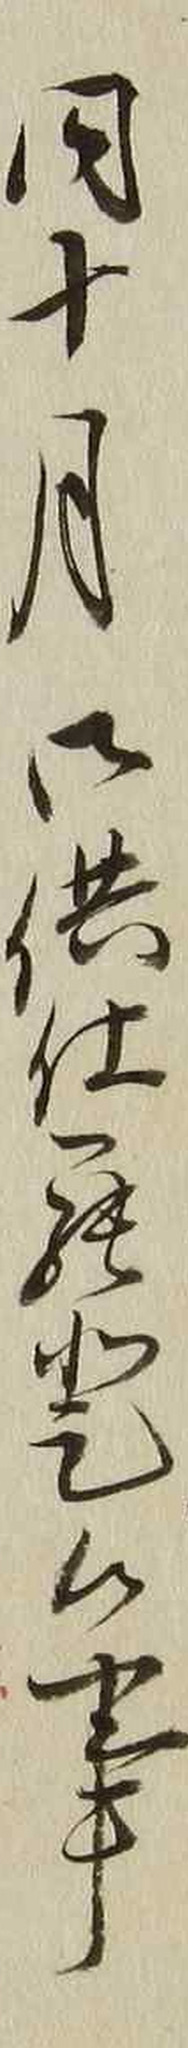同十月御供仕罷登候事
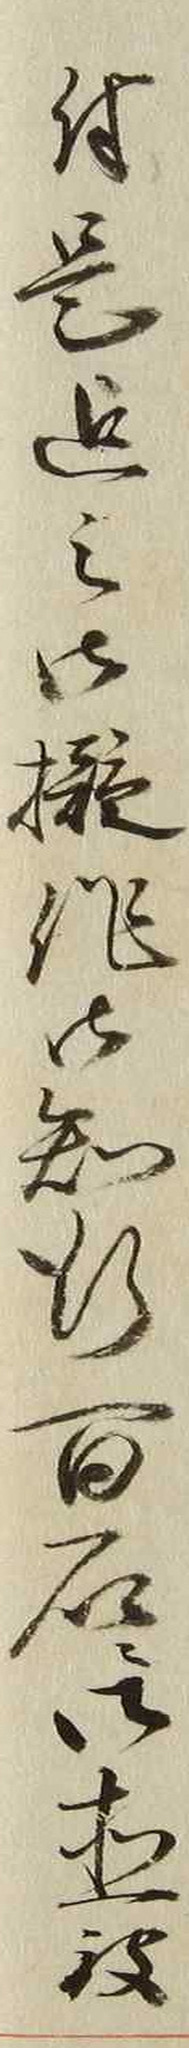付是迄之御擬作御知行百石に御直被
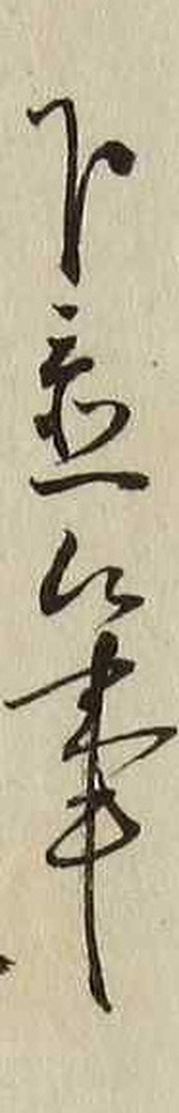下置候事
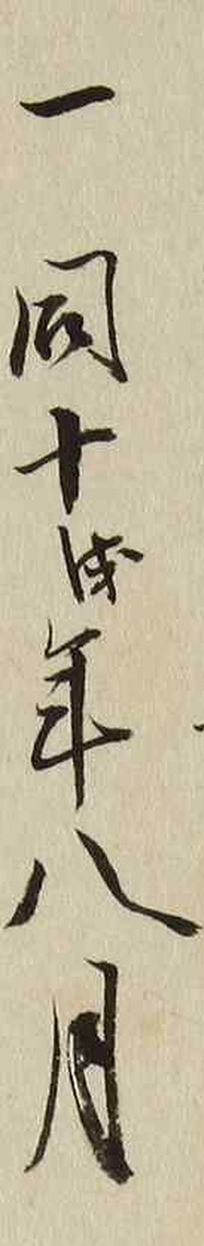一同十戌年八月
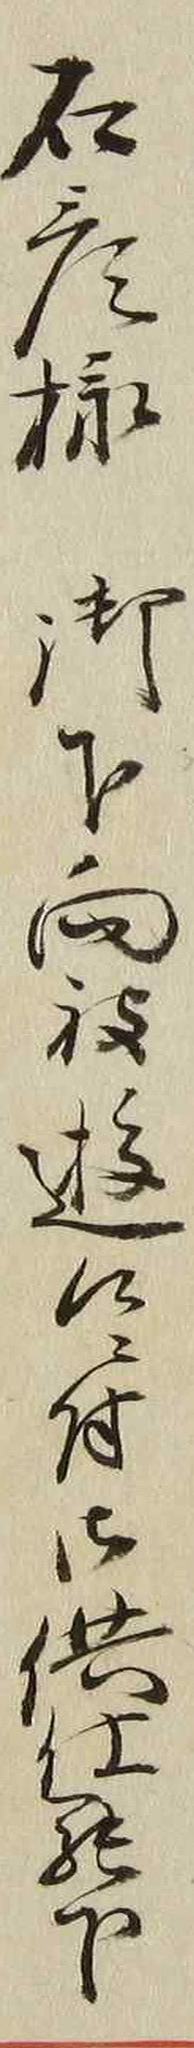石彦様御下向被遊候に付御供仕罷下
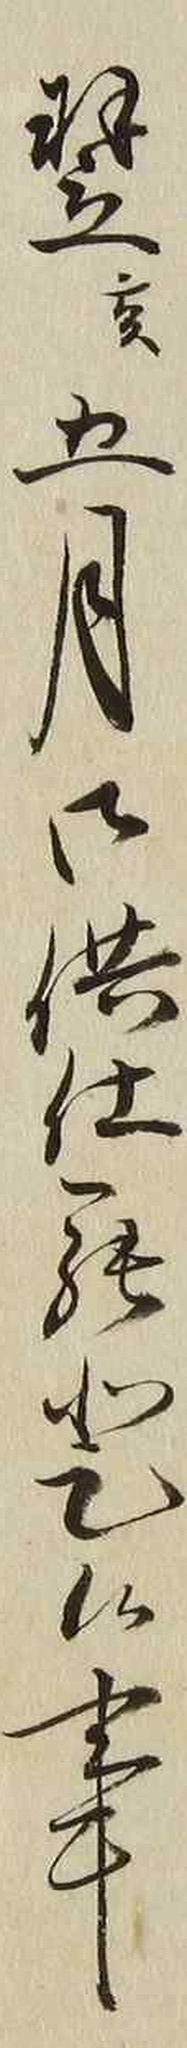翌亥五月御供仕罷登候事
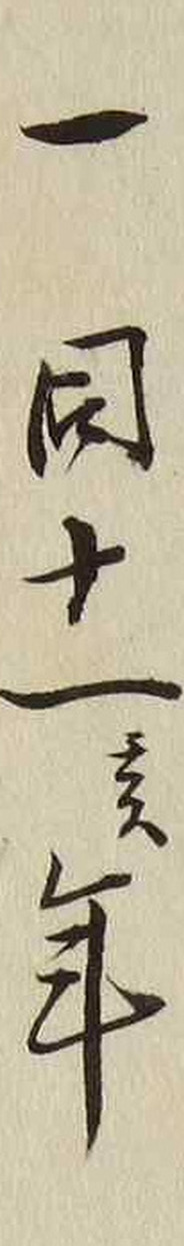一同十一亥年
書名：諸士系譜　巻之157　ね之部1
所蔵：会津若松市立会津図書館
